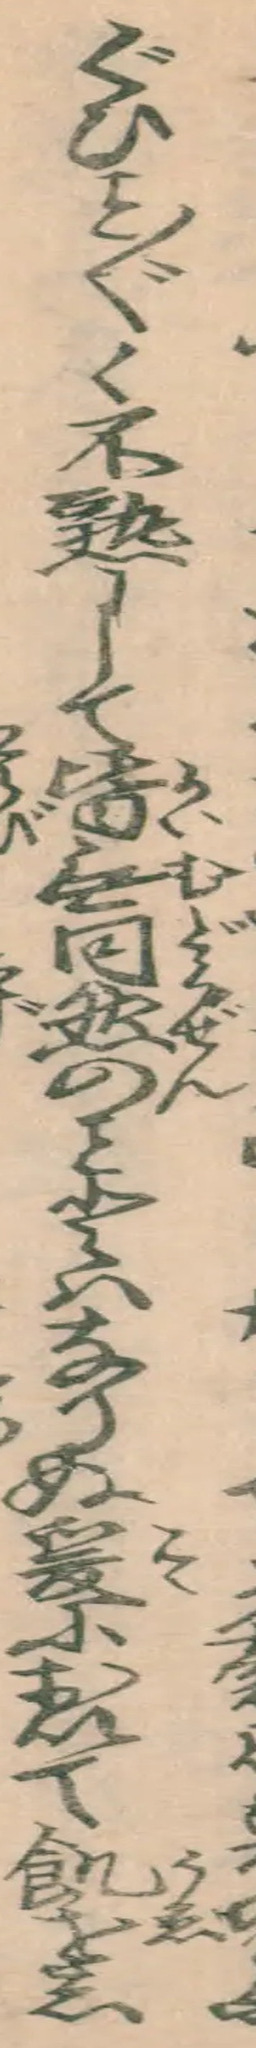ぐひこと〴〵く不熟にして皆無同然のこととはなりぬ爰におひて飢をし
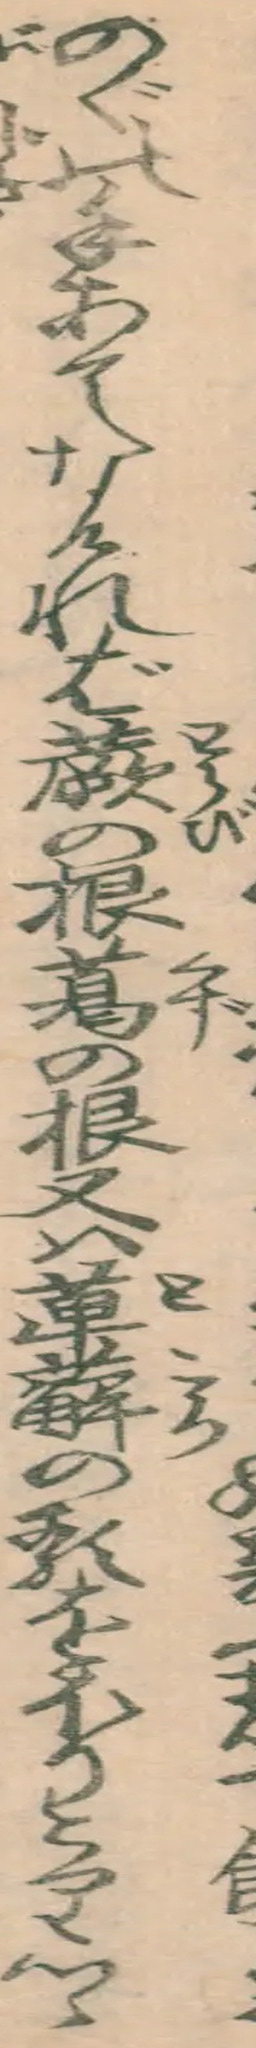のぐの手あてなければ蕨の根葛の根又は萆薢の類をほりとりつゝ
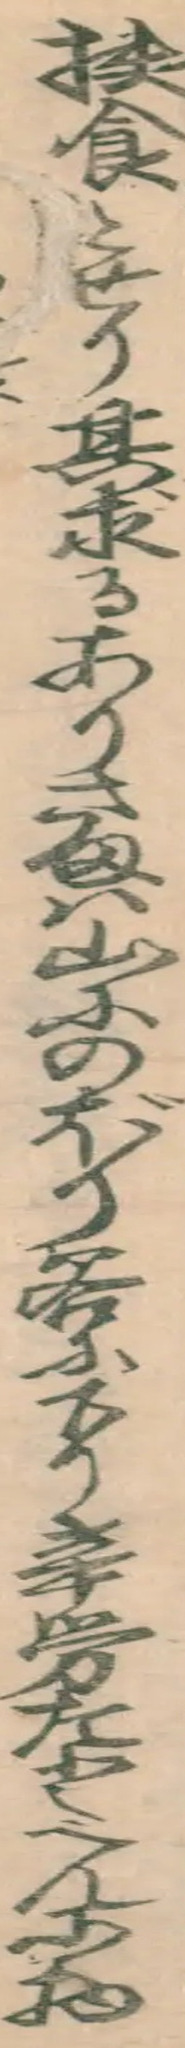扶食とせり其求るありさまは山にのぼり谷に下り辛労たとへんに物
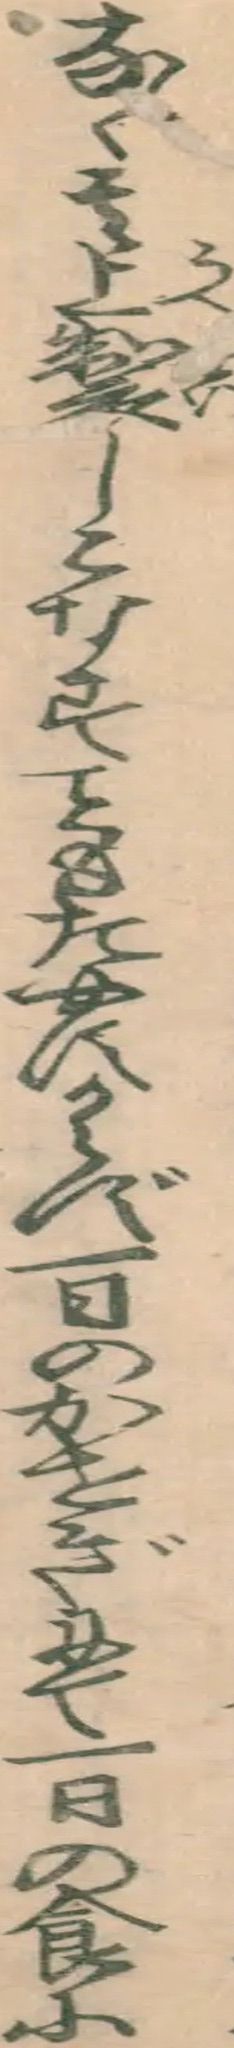なく其上製しこなすこともたやすからず一日のかせぎにて一日の食に
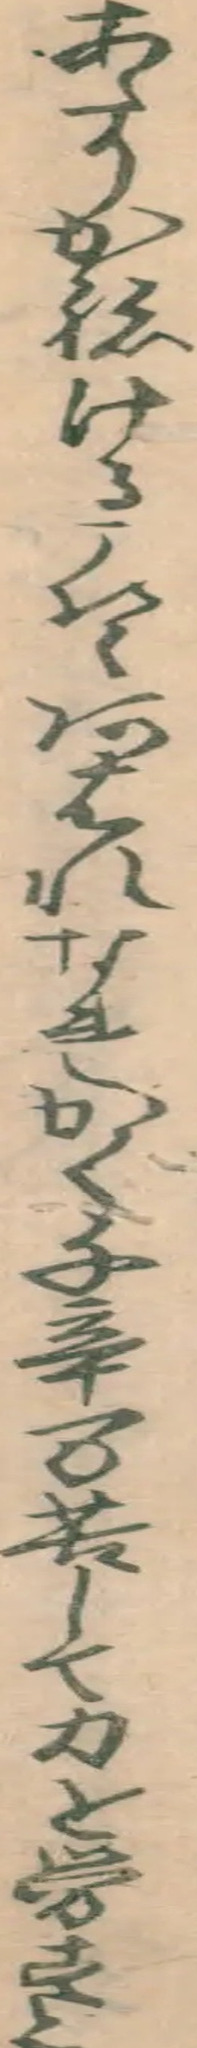あたりかねけるこそあはれなれかく千辛万苦して力を労すと

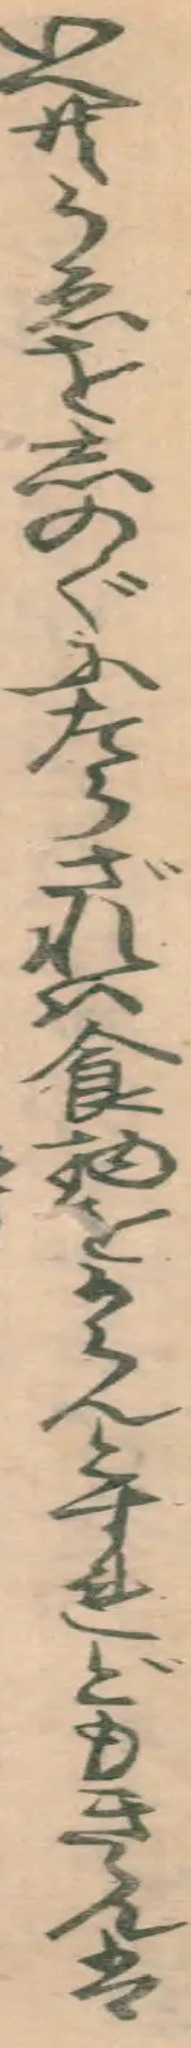いへ共うゑをしのぐにたらざれは食物をからんとすれどもきゝんは
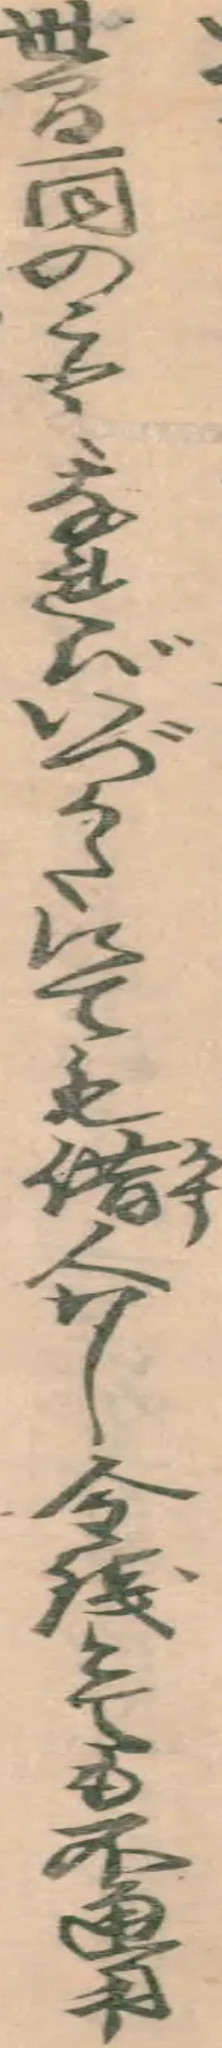世間一同のことなればいづかたにても借人なし金銭とても不通用
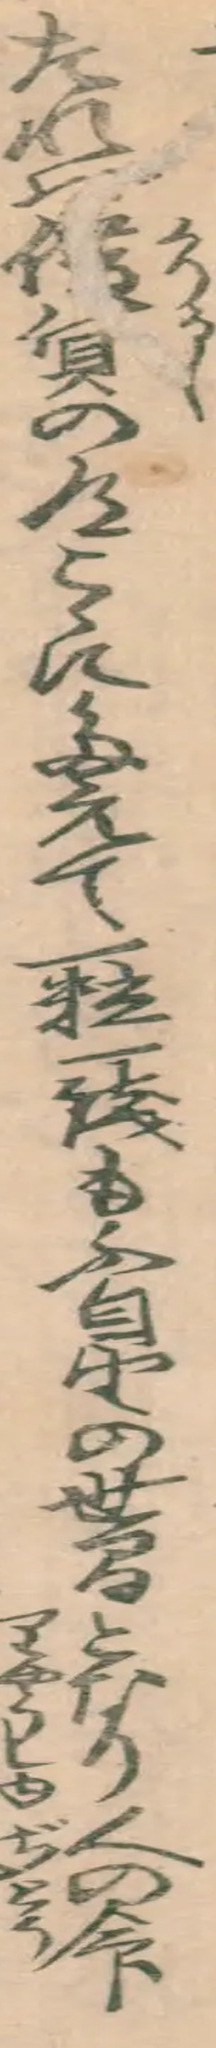たれば借貸の道こゝにたえて一粒一銭も不自由の世間となり人の命
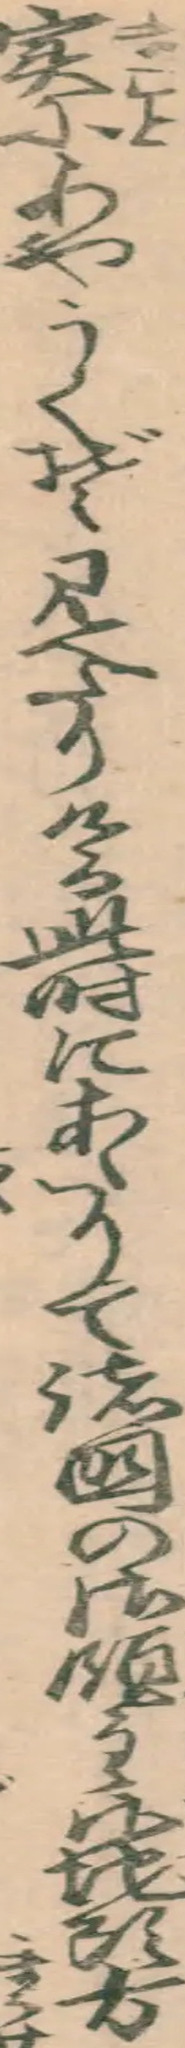実にあやうくぞ見へたりける此時にあたりて諸国の御領主御地頭方
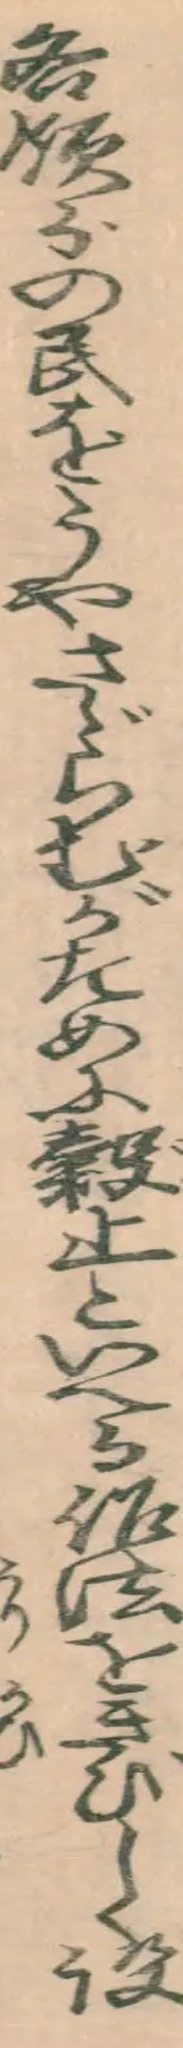各領分の民をたやさゞらむがために穀止といへる作法をきびしく設
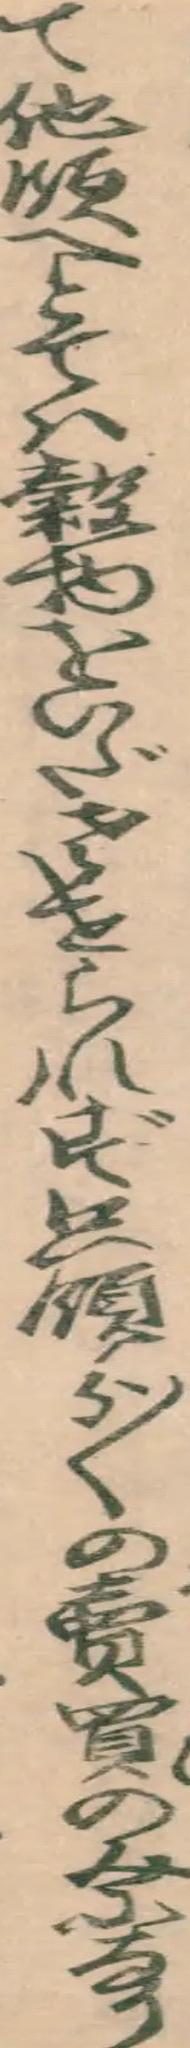て他領へとては穀物をいださせられず只領分〳〵の売買のみになり
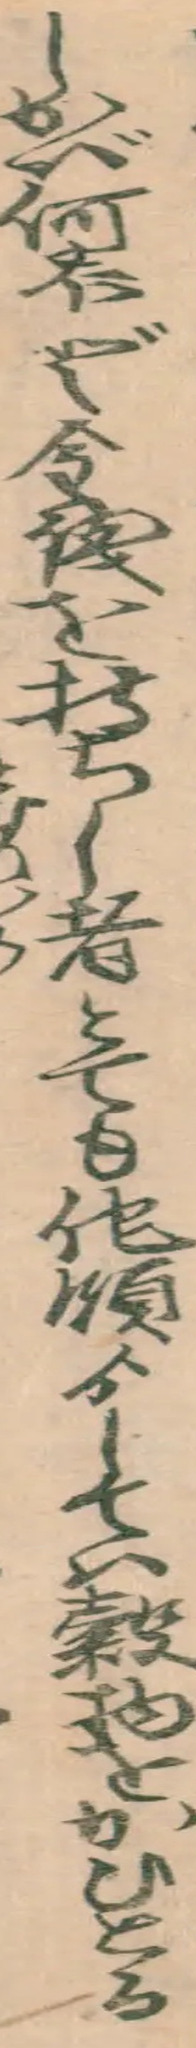しかば何ほど金銭を持ちし者とても他領よりしては穀物をかひとる
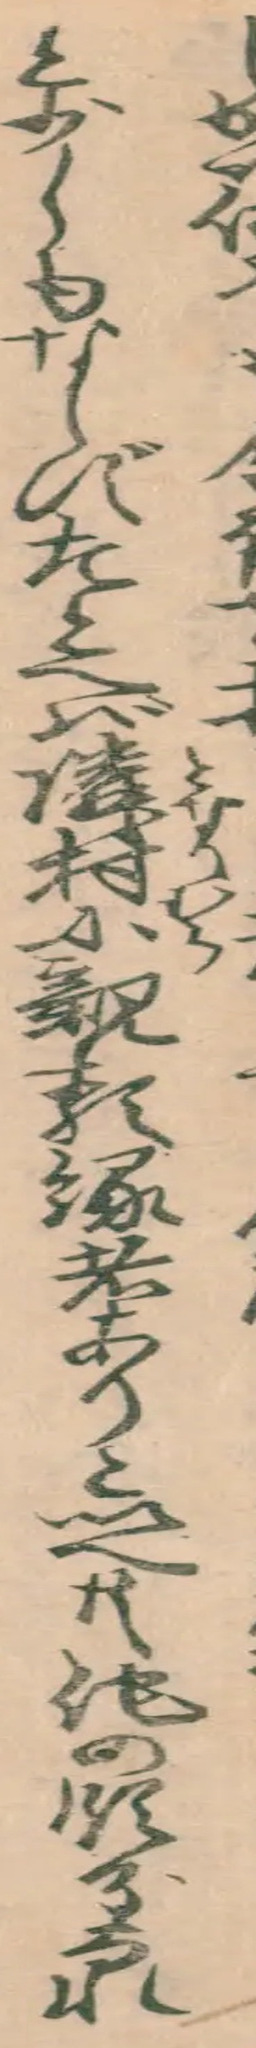こと少しもならずたとへば隣村に親類縁者ありといへ共他の領分なれ
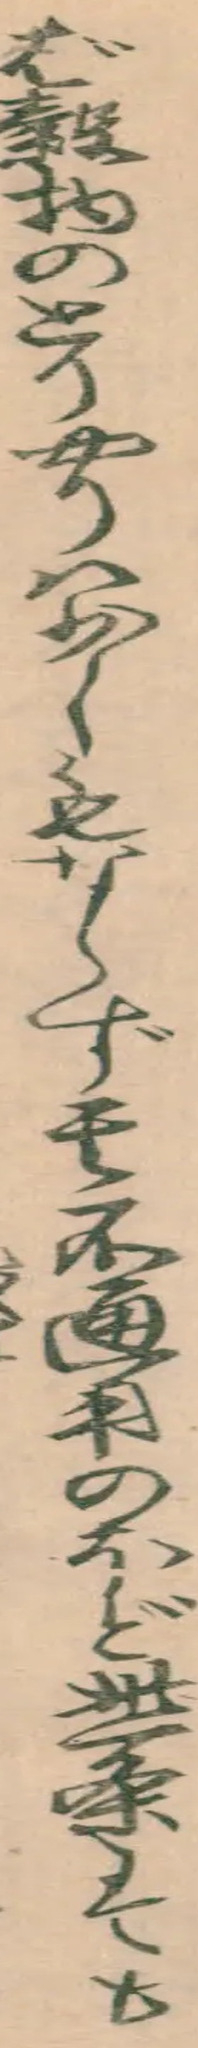ば穀物のとりやりは少しもならず其不通用のほど此一条にても
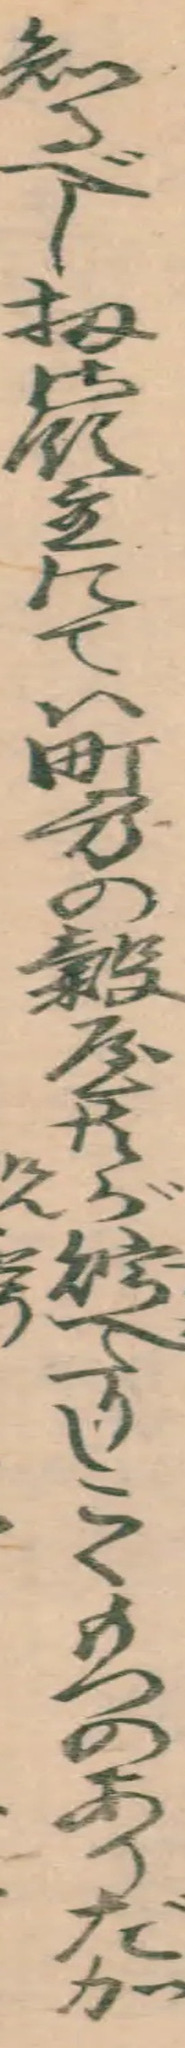知るべし扨御領主にては町方の穀屋共が貯へたりしこくもつのありだか
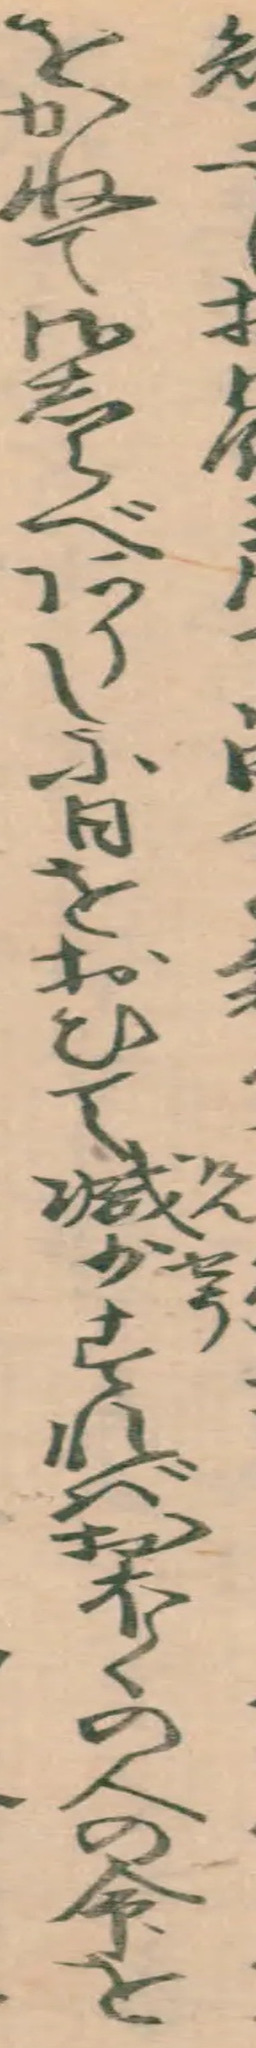をかねて御しらべありしに日をおひて減少すればおほくの人の命を
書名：日ごとの心得
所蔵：国立国会図書館 National Diet Library, JAPAN
